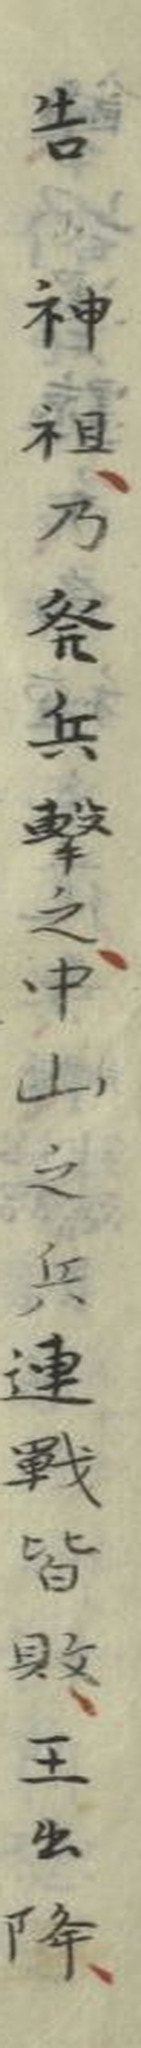告神祖、乃発兵撃之、中山之兵連戦皆敗、王出降、
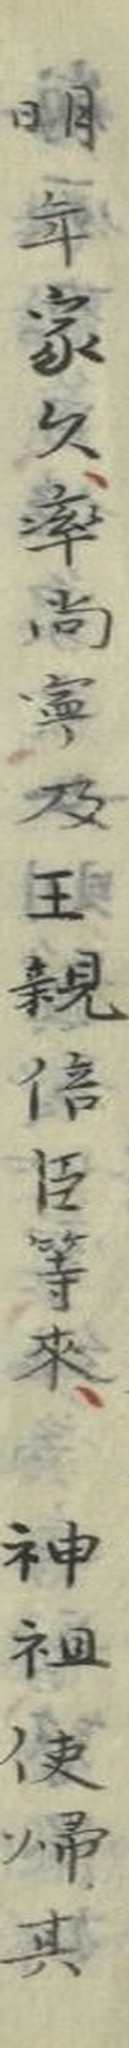明年家久、率尚寧及王親倍臣等来、神祖使帰其
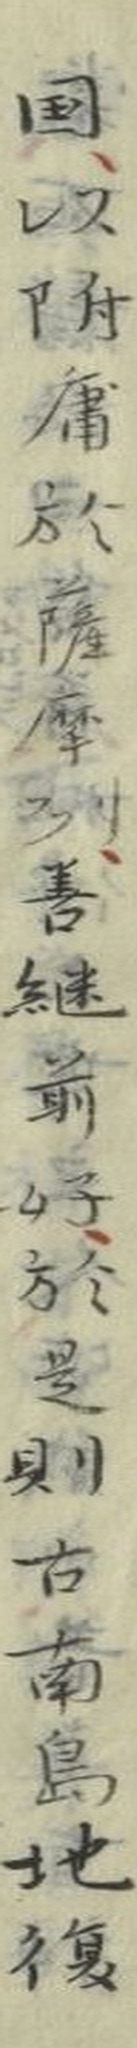国、以附庸於薩摩州、善継前好、於是則古南島地復
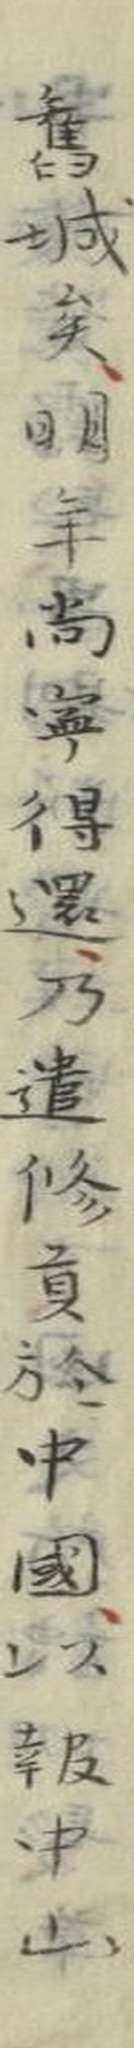舊城矣、明年尚寧得還、乃遣修貢於中国、以報中山
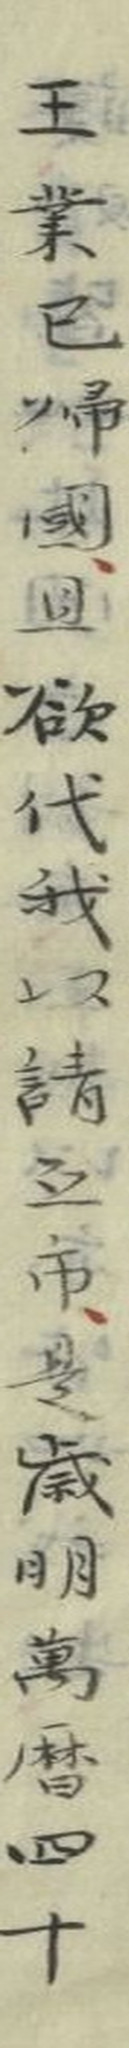王業已帰国、欲代我以請互市、是歳明万暦四十
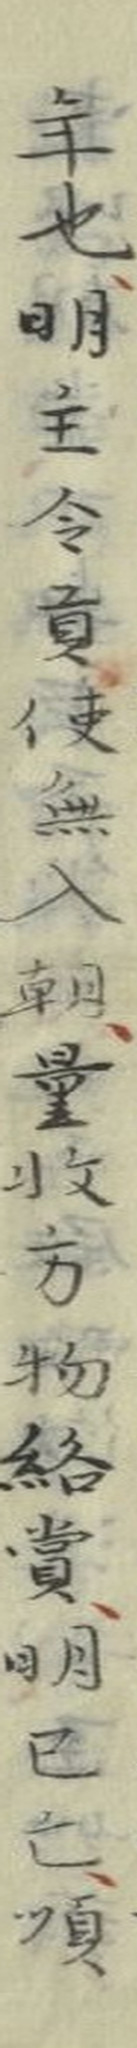年也、明主令貢使無入朝、量収方物絡賞、明已亡、順
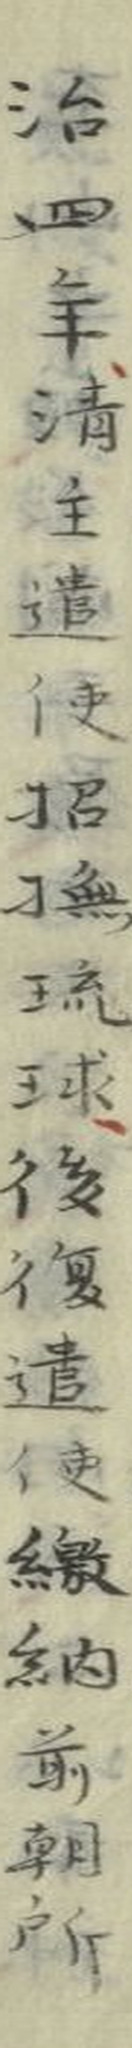治四年、清主遣使招撫琉球、後復遣使繳納前朝所
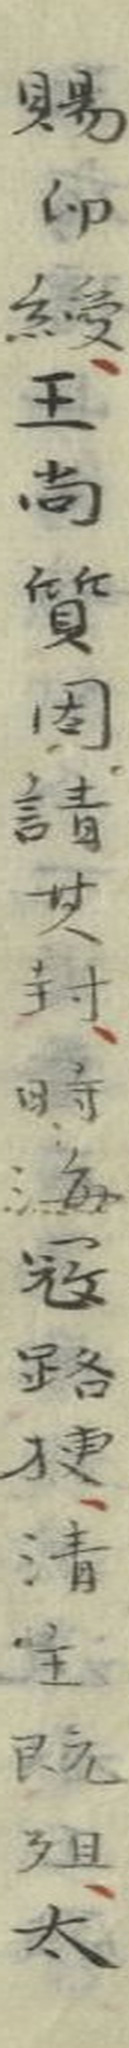賜印綬、王尚質因請其封、時海冠路梗、清主既殂、太
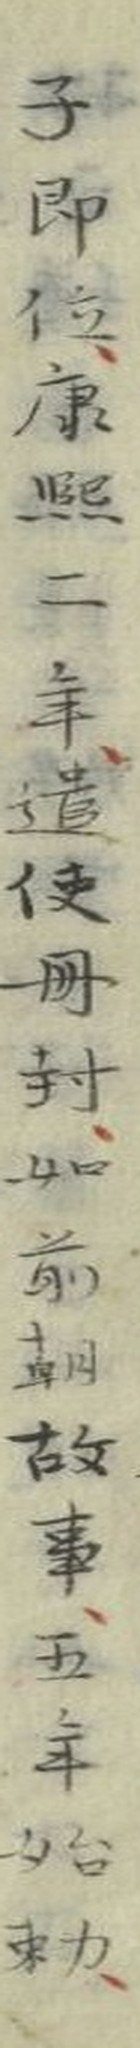子即位、康熙二年遣使冊封、如前朝故事、五年始勅、
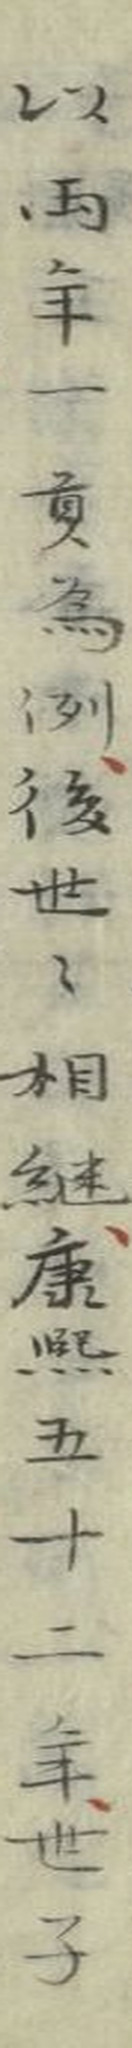以両年一貢為例、後世々相継、康熙五十二年、世子
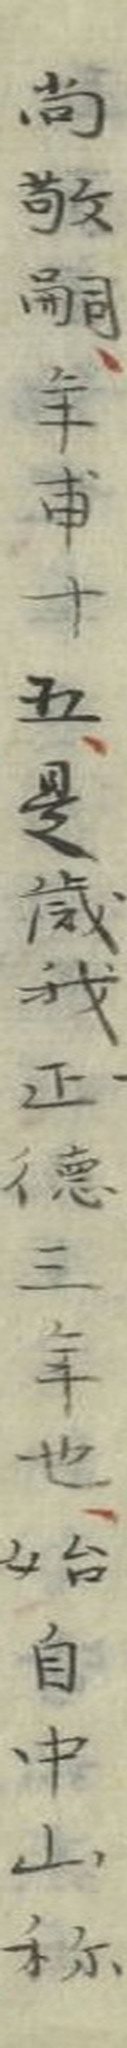尚敬嗣、年甫十五、是歲我正徳三年也、始自中山称
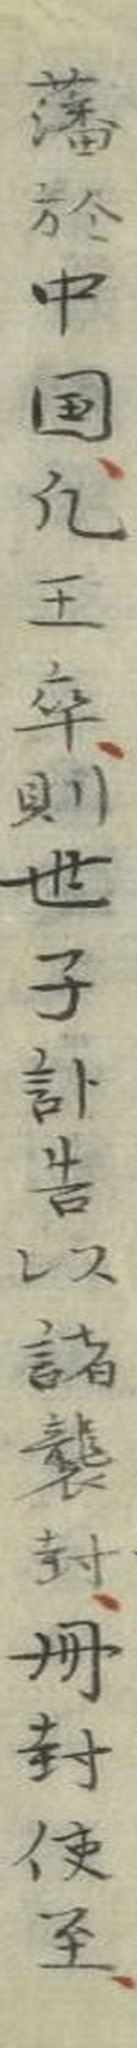藩於中国、凡王卒、則世子訃告以諸襲封、冊封使至、
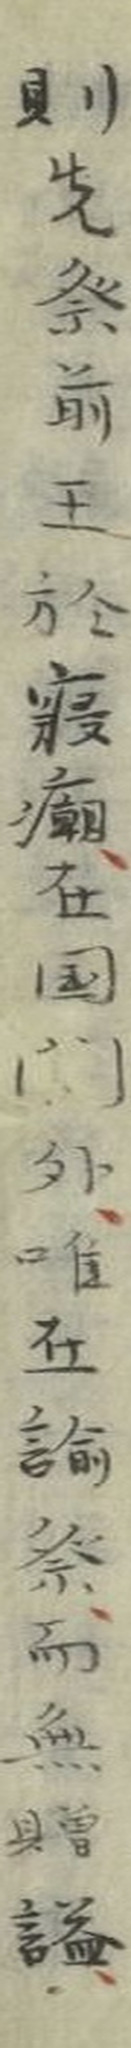則先祭前王於寝廟、在国門外、唯在諭祭、而無贈謚、
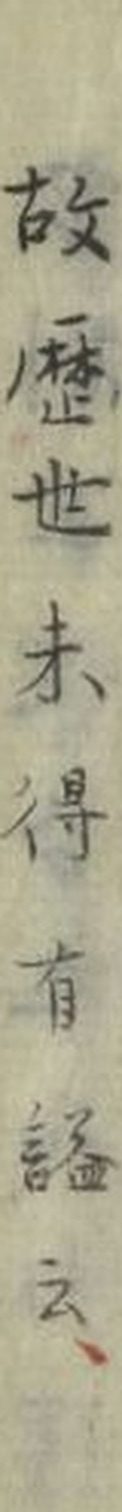故歴世未得有謚云、

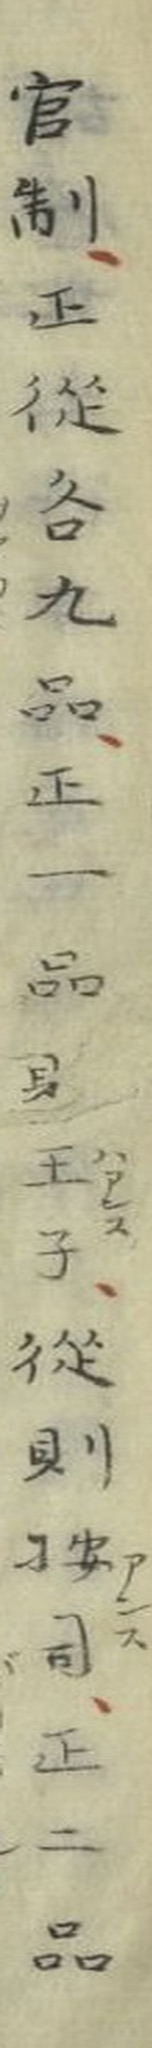官制、正従各九品、正一品王子、従則按司、正二品
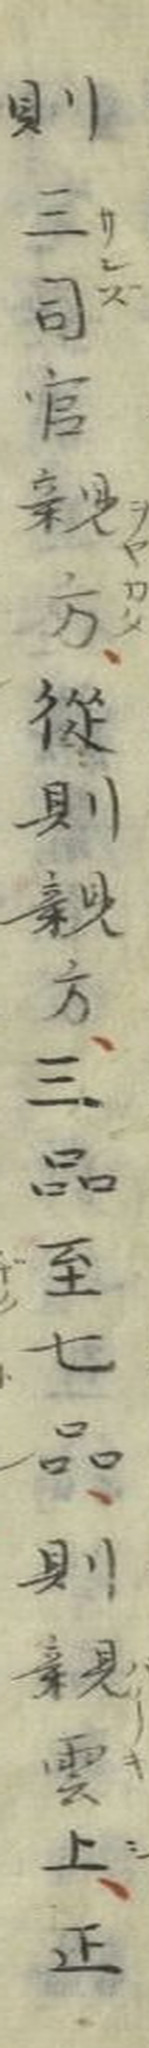則三司官親方、従則親方。三品至七品、則親雲上、正
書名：琉球
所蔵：University of the Ryukyus Library
